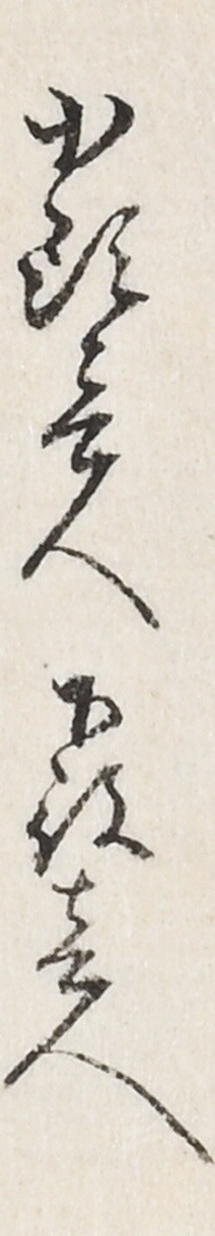小頭壱人下役壱人

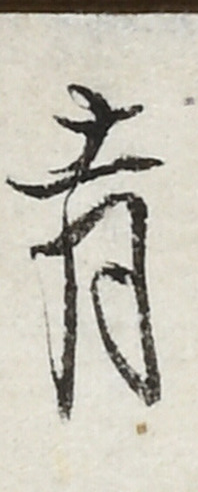十一月
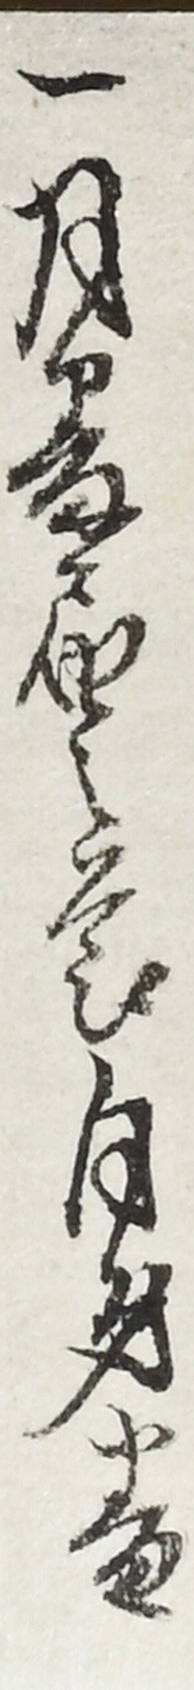一月番届之節自身中番
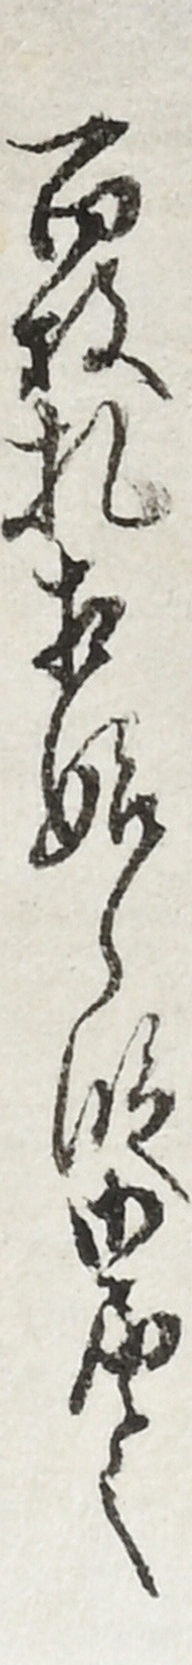一百枚札相始之段御届也
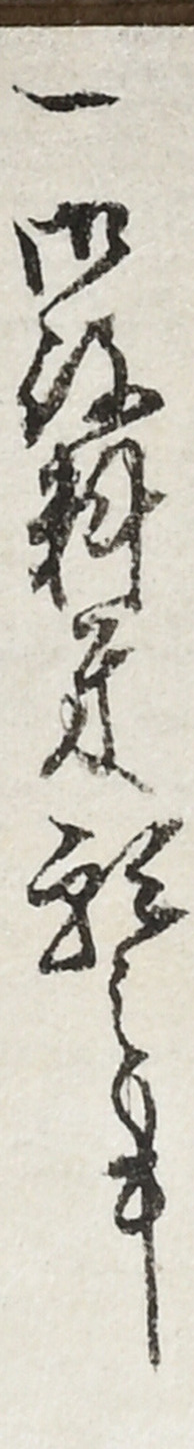一御役料米願之事
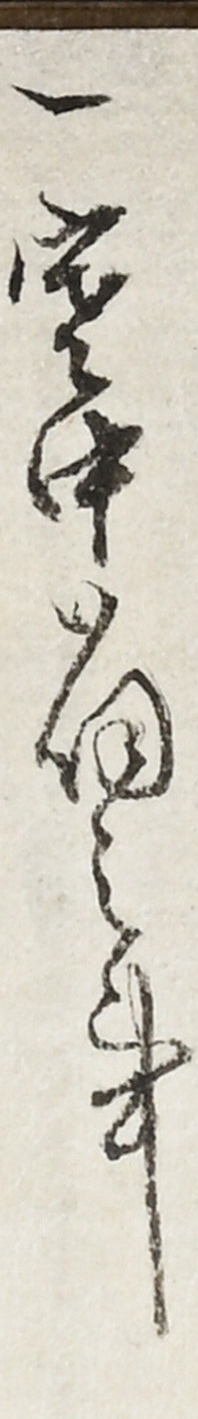一寒中御伺之事
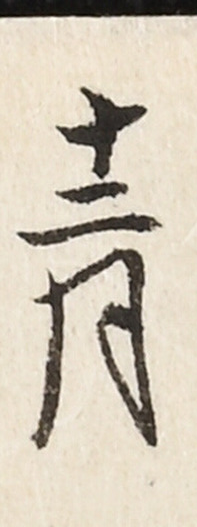十二月
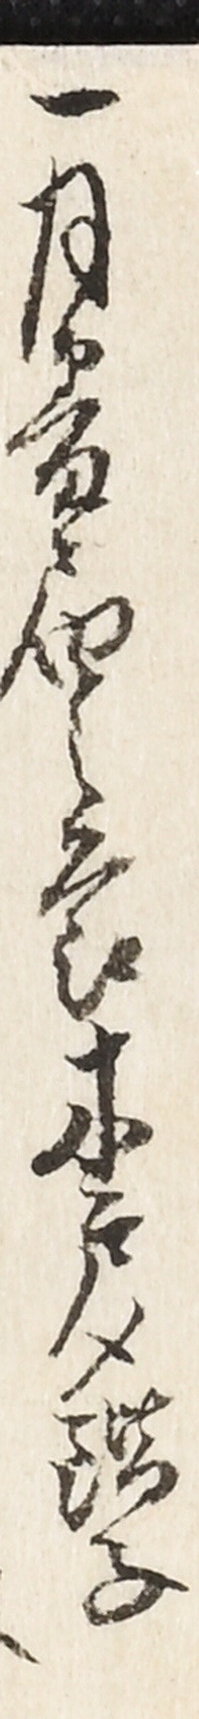一月番届之之節木戸〆階子
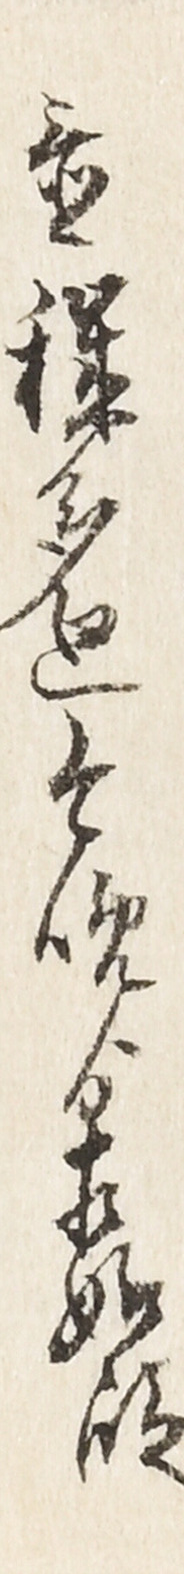置穢多廻今晩ゟ相始段
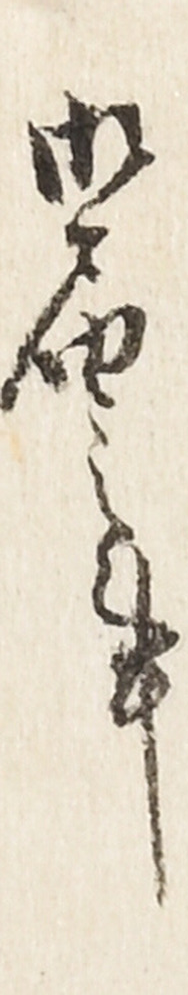御届之事
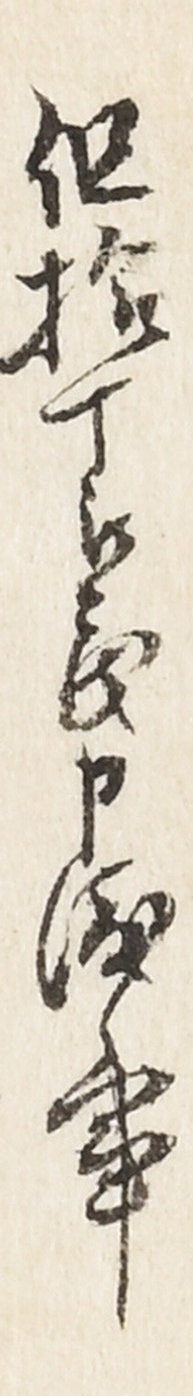但拾丁江も申渡候事
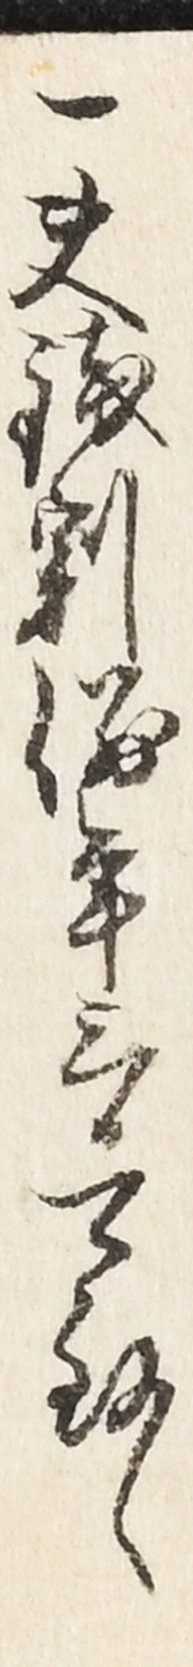一夫錢割例年三日可致候
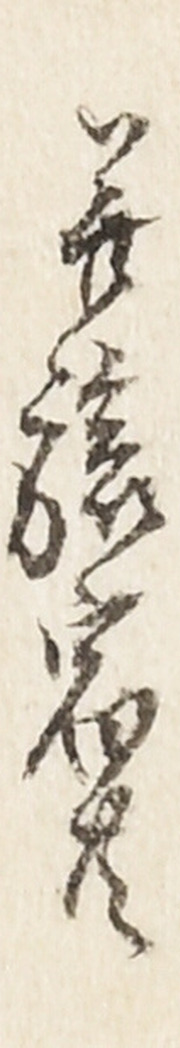并旅宿共
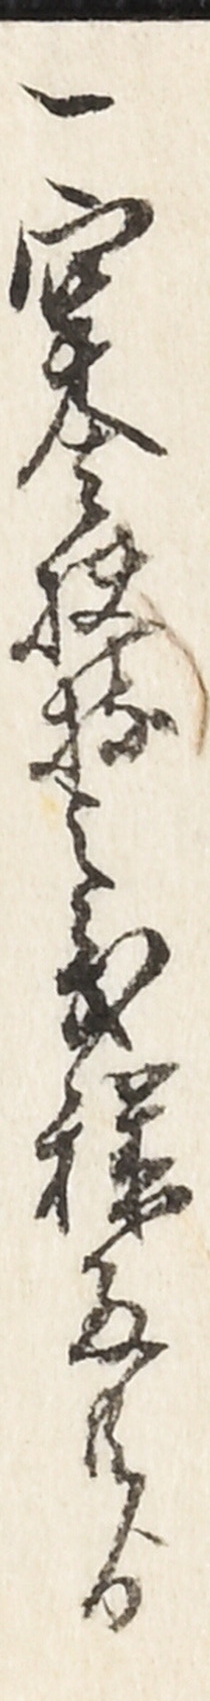一実金扶持之義穢多共より
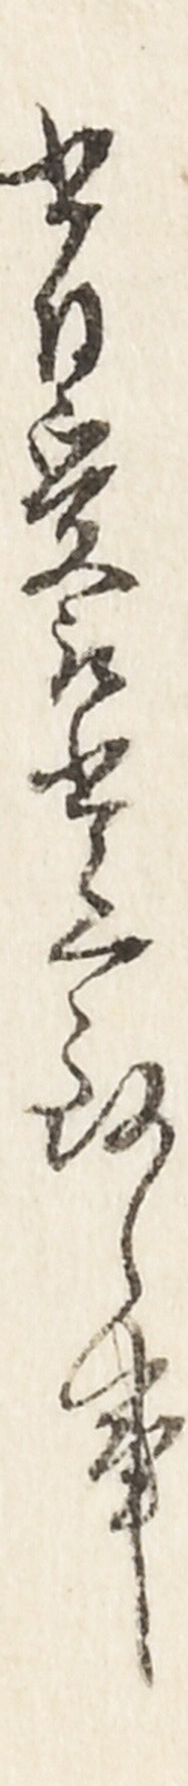書付受取書上致候事
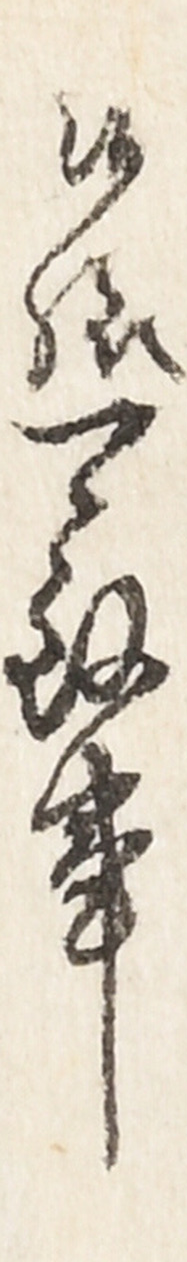候様可致事
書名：年内行事懐中録
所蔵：伊那市立高遠町図書館・合同会社AMANE
